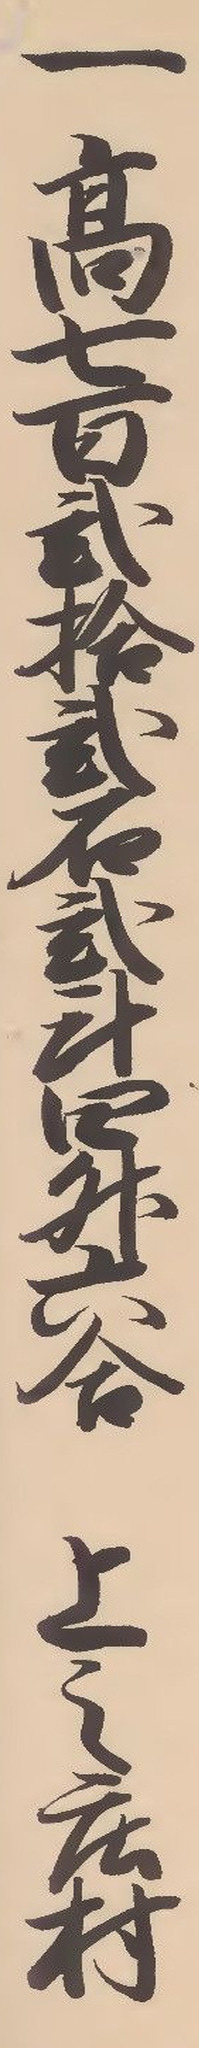一高七百弐拾弐石弐斗四升六合上之庄村
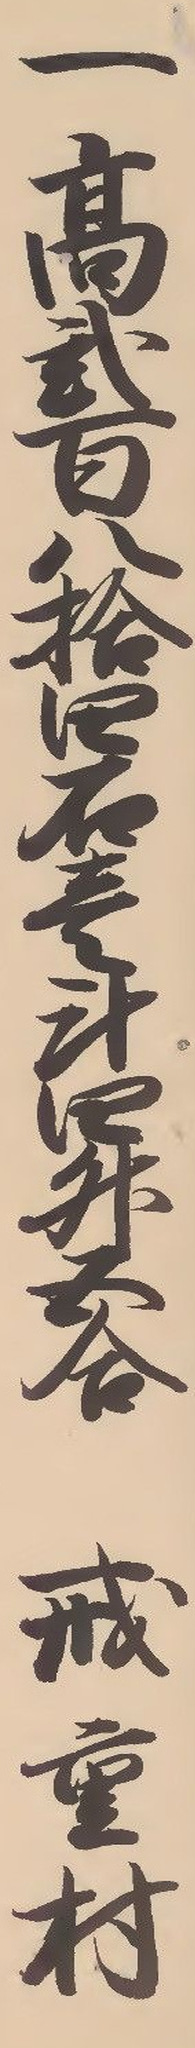一高弐百八拾四石壱斗四升五合戒重村
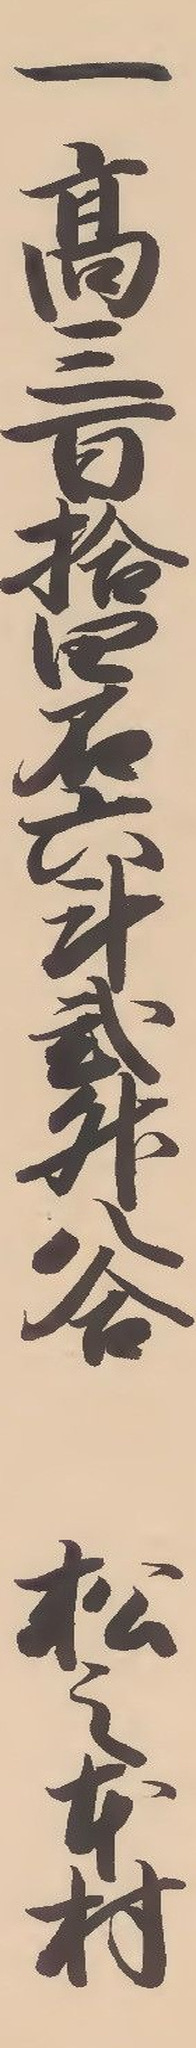一高三百拾四石六斗弐升八合松之本村
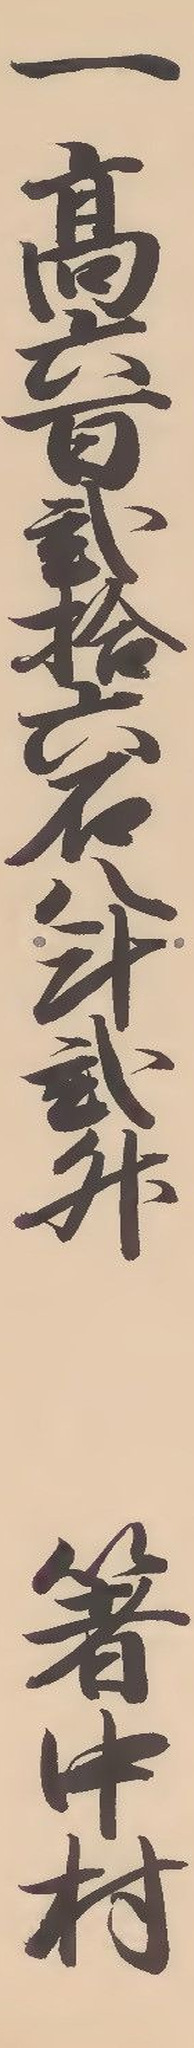一高六百弐拾六石八斗弐升箸中村

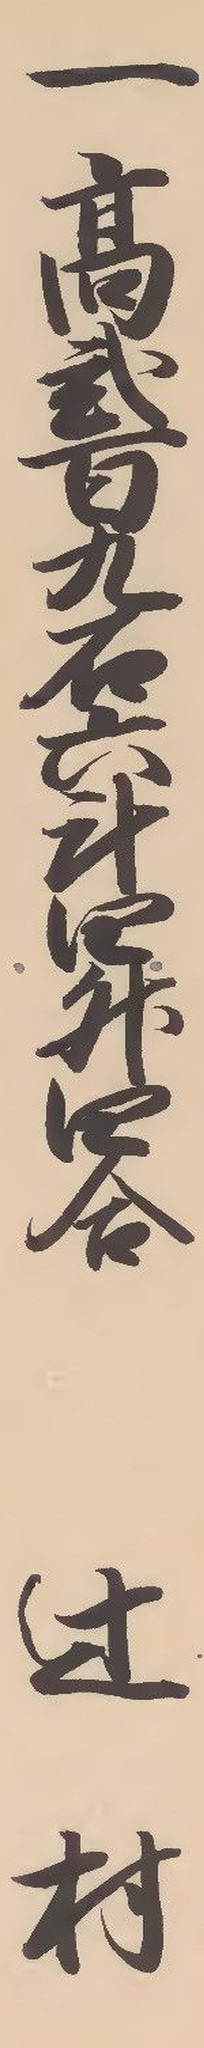一高弐百九石六斗四升四合辻村
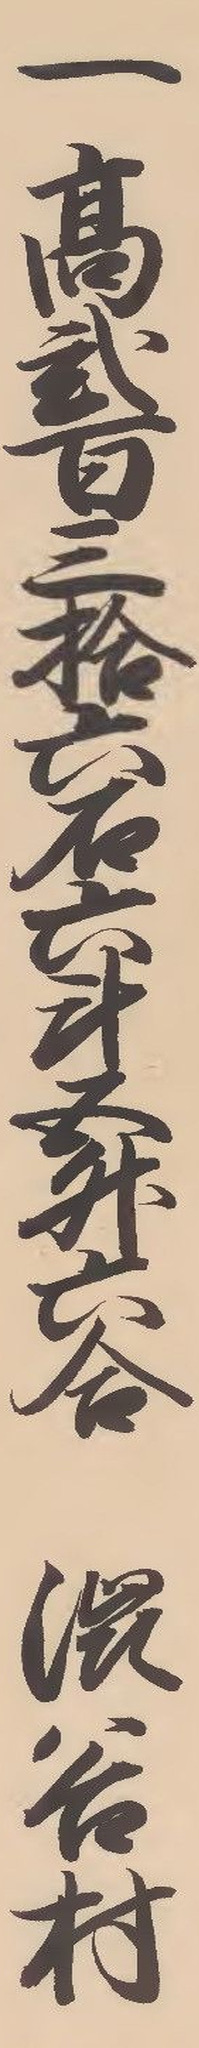一高弐百三拾六石六斗五升六合渋谷村
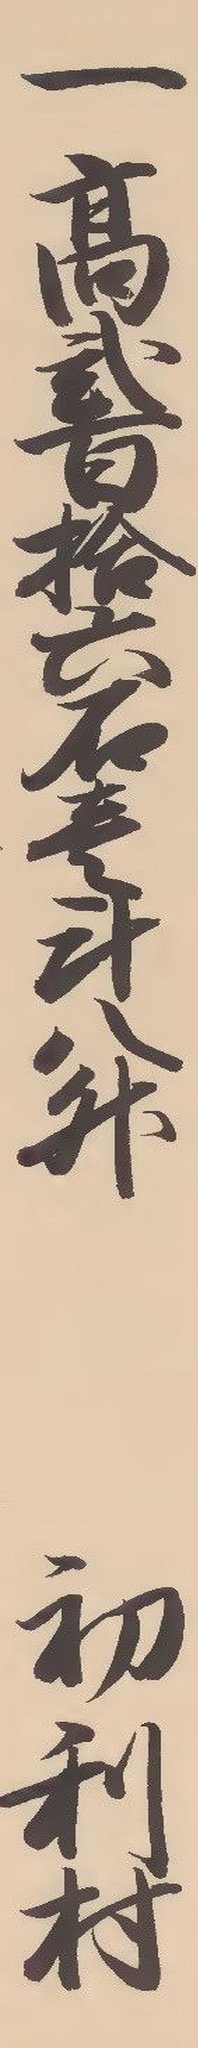一高弐百拾六石壱斗八升初利村
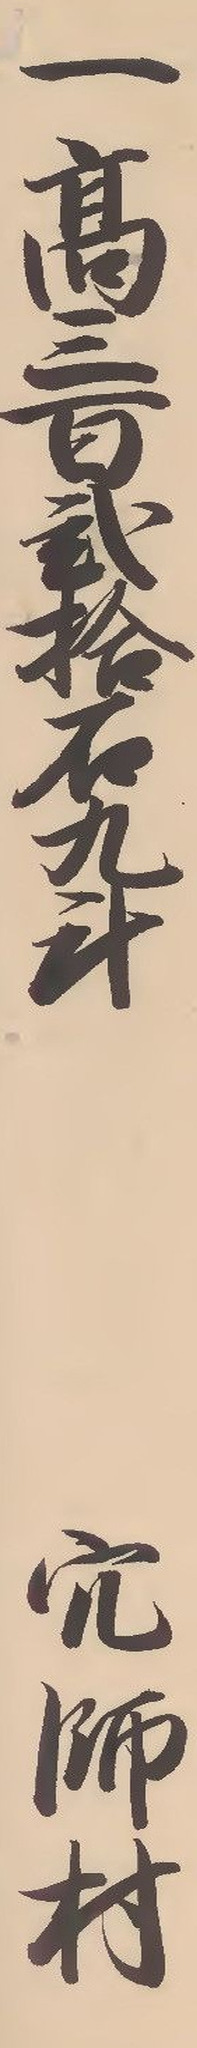一高三百弐拾石九斗穴師村
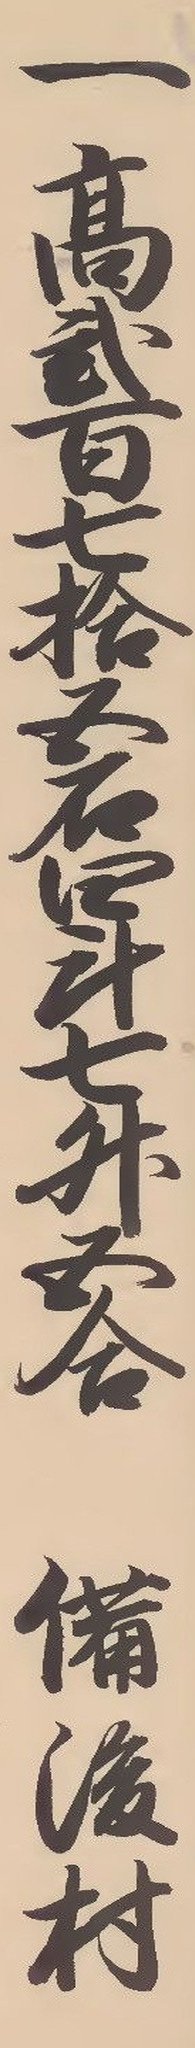一高弐百七拾五石四斗七升五合備後村
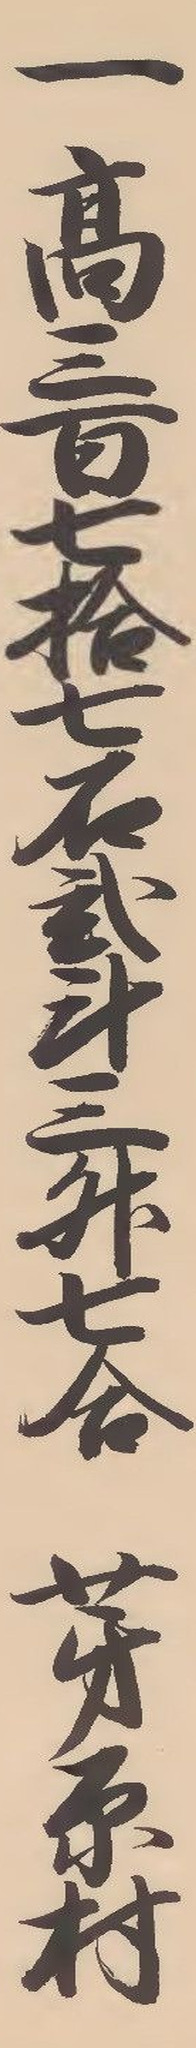一高三百七拾七石弐斗三升七合茅原村
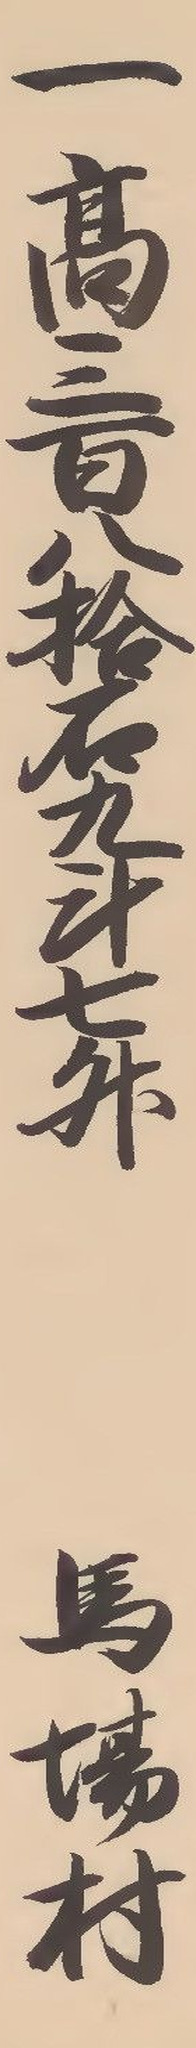一高三百八拾石九斗七升馬場村
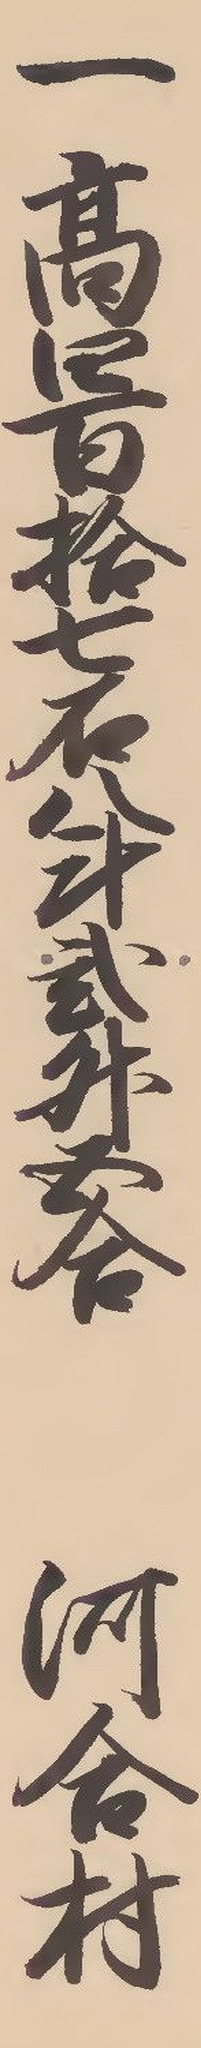一高四百拾七石八斗弐升五合河合村

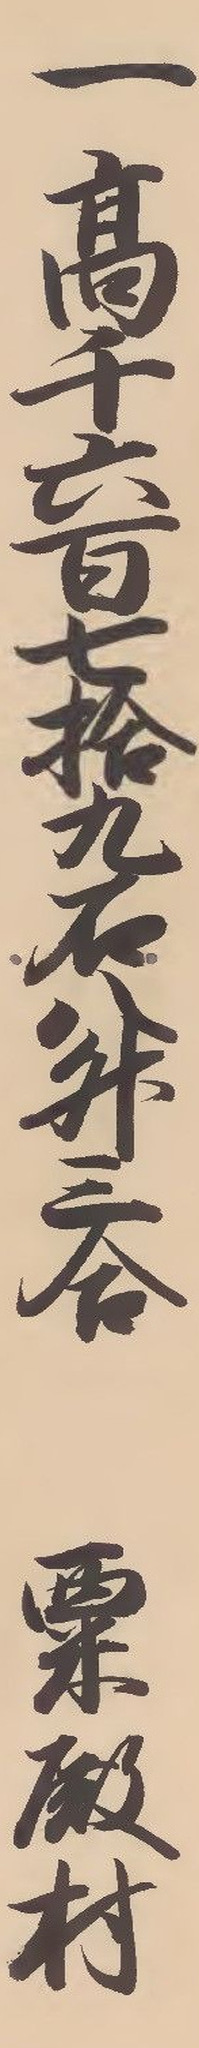一高千六百七拾九石八升三合粟殿村
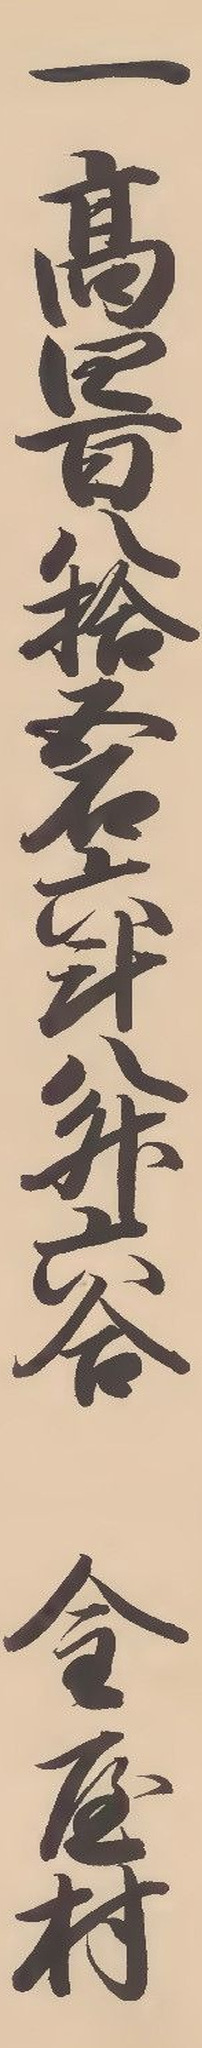一高四百八拾五石六斗八升六合金屋村
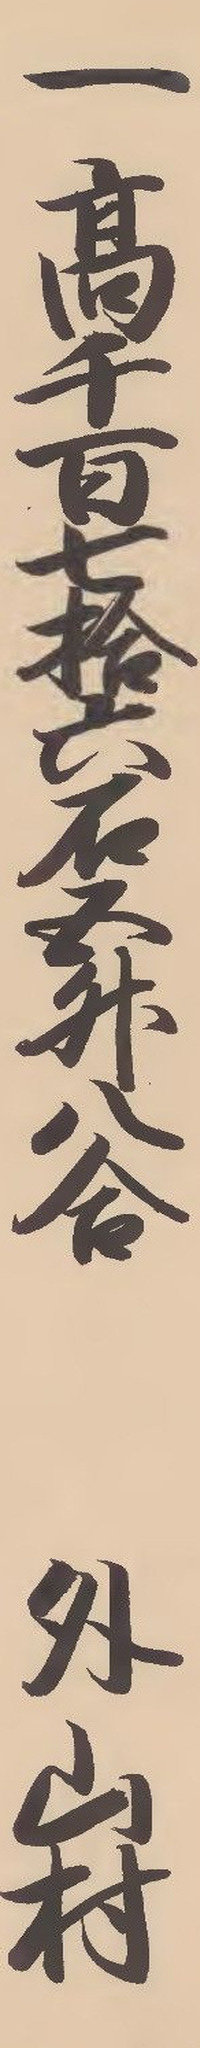一高千百七拾六石五升八合外山村
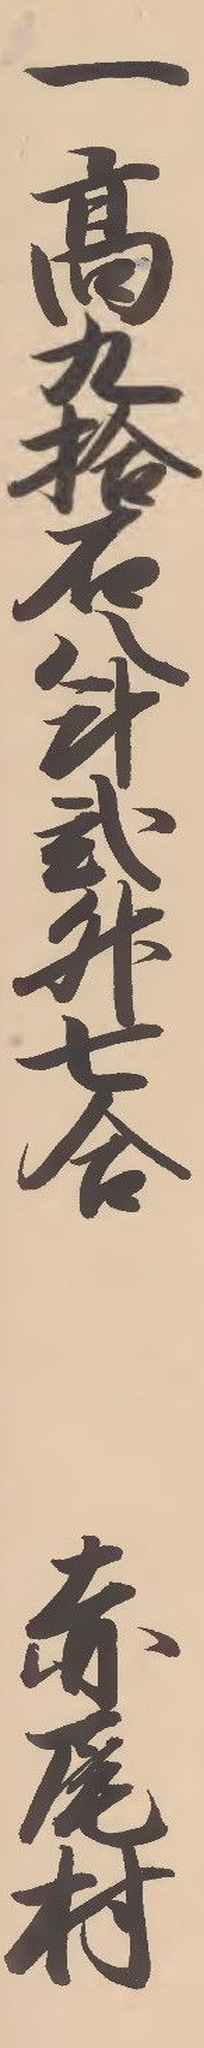一高九拾石八斗弐升七合赤尾村
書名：大和国郷帳
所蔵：国立公文書館 National Archives of Japan
